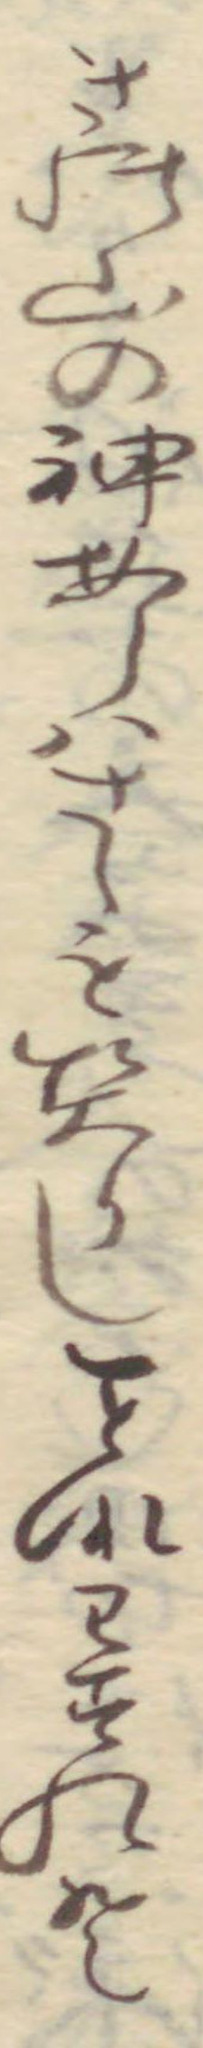きの山の神ならはさしも契りしことなわすれそ
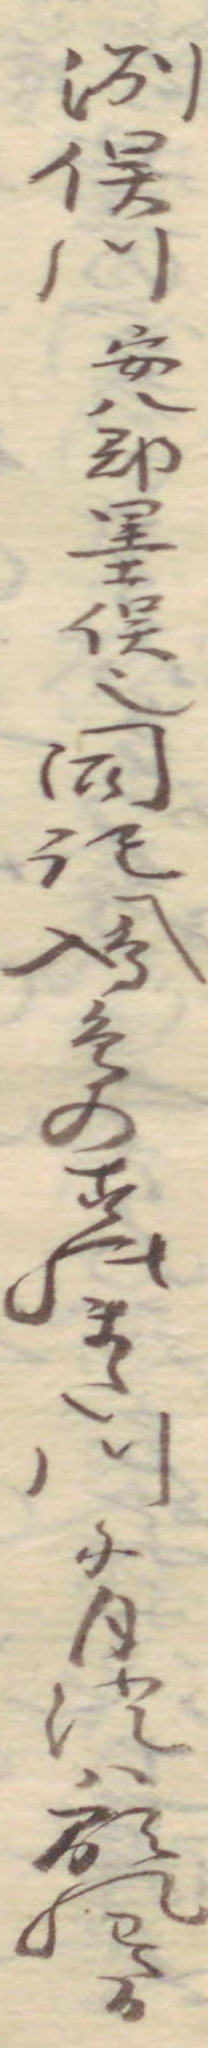洲俣川安八郡墨俣也同記〽鳰鳥のすのまた川に月沈は顕風わたる
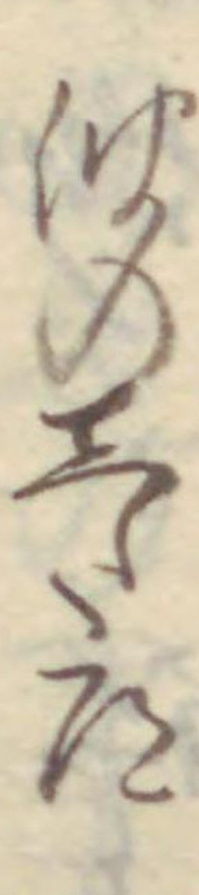波のした道
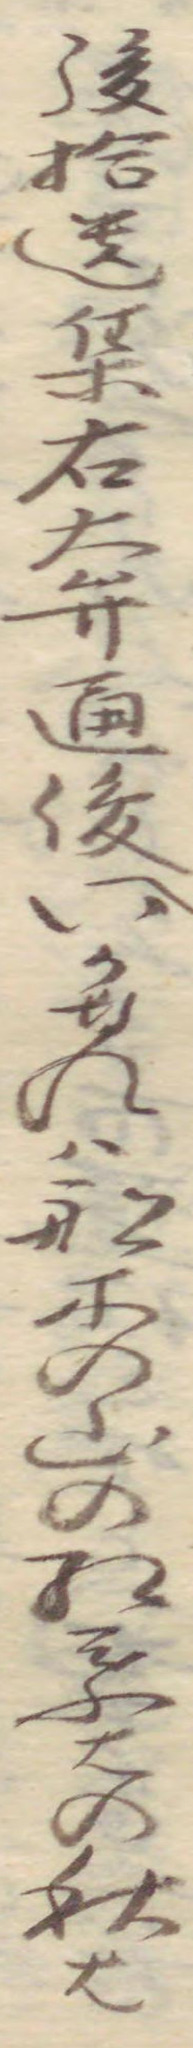後拾遺集右大弁通俊〽いかなれは船木の山の紅葉はの秋は
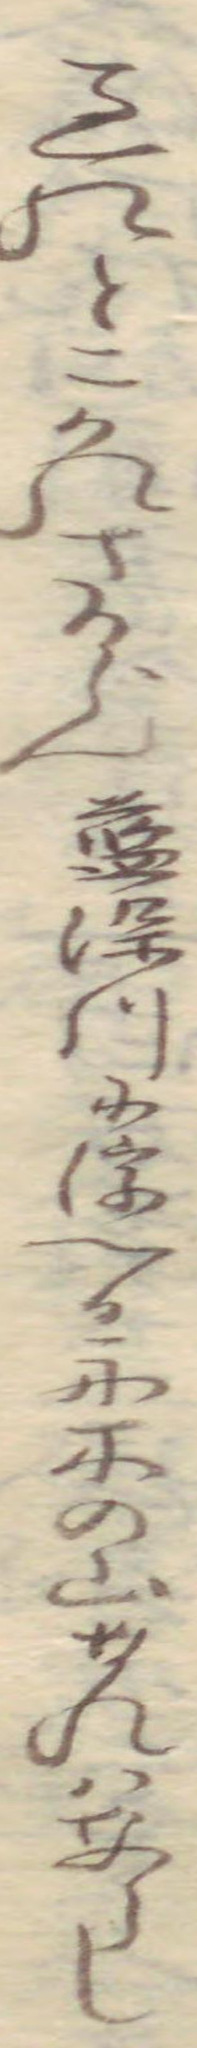過れとこかれさるらん藍染川に浮へる舟木の山なれはならし
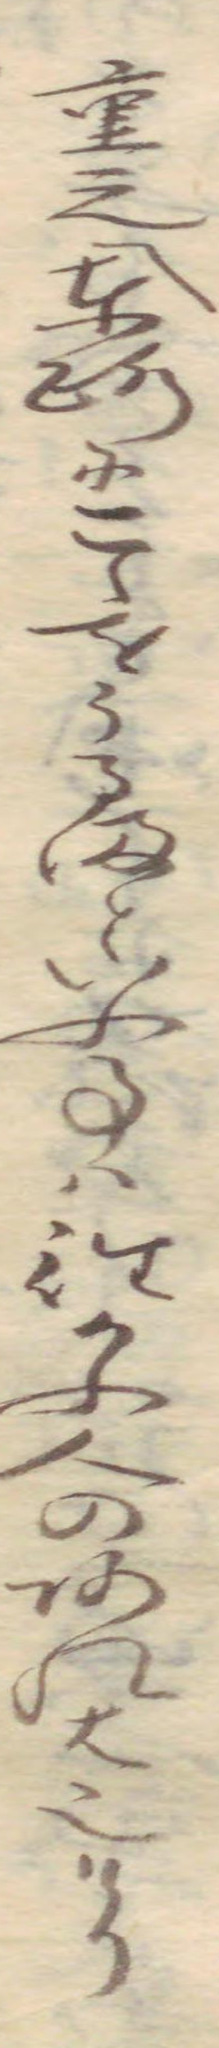重行〽東路にこゝをうるまといふ事は往かふ人のあれは也けり
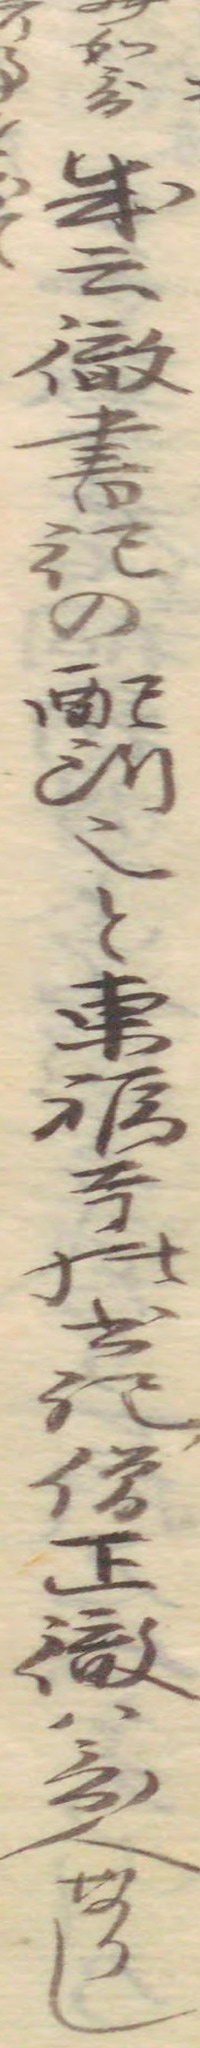或云徹書記の配所也と東福寺の書記ノ僧正徹は歌人なりし
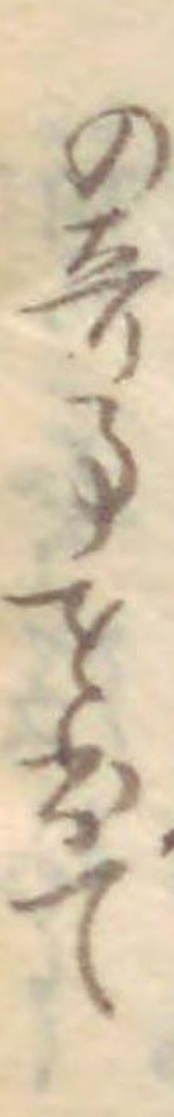の奇事を書て

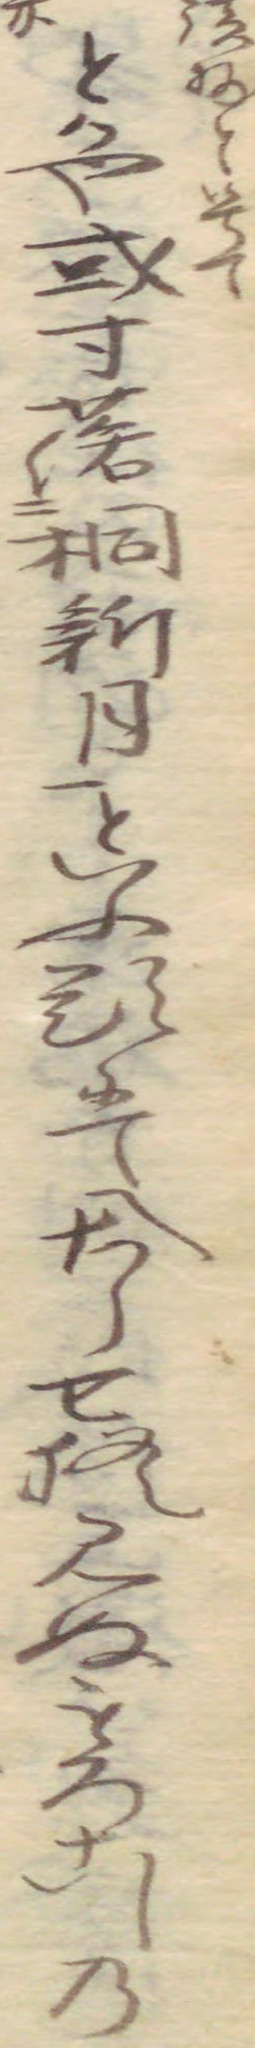とかや或時落桐新月といふ題にて〽ちらせ猶見ぬもろこしの
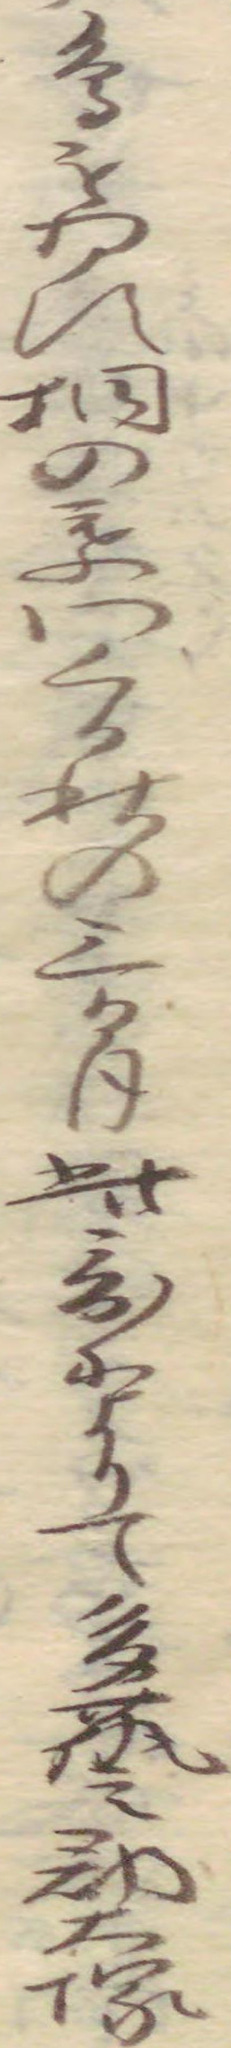鳥もゐす桐の葉わくる秋の三日月此歌によりて多藝郡大塚
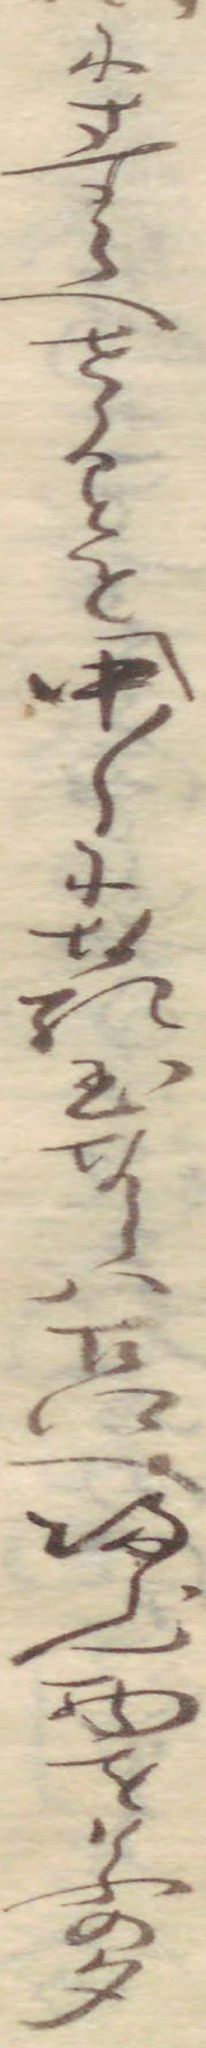にさすらへせらるとそ〽中〳〵になき玉ならは古郷へ帰らん物をけふの夕
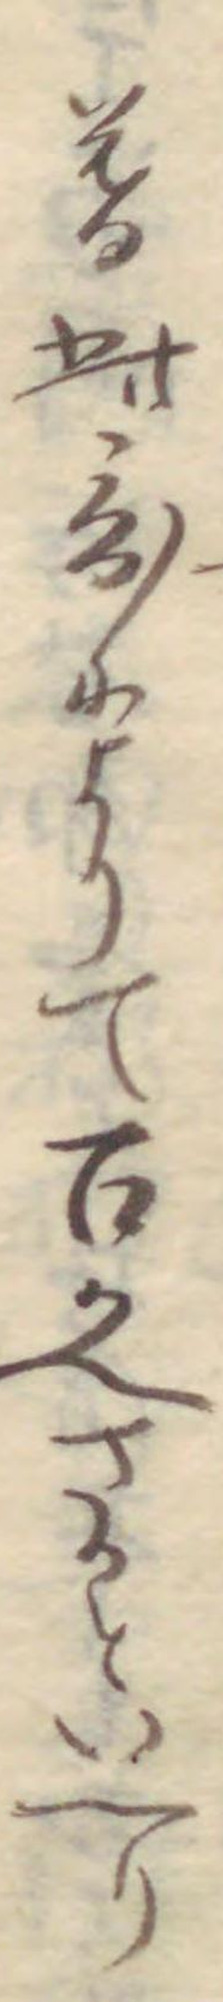暮此歌によりて召かへさるといへり
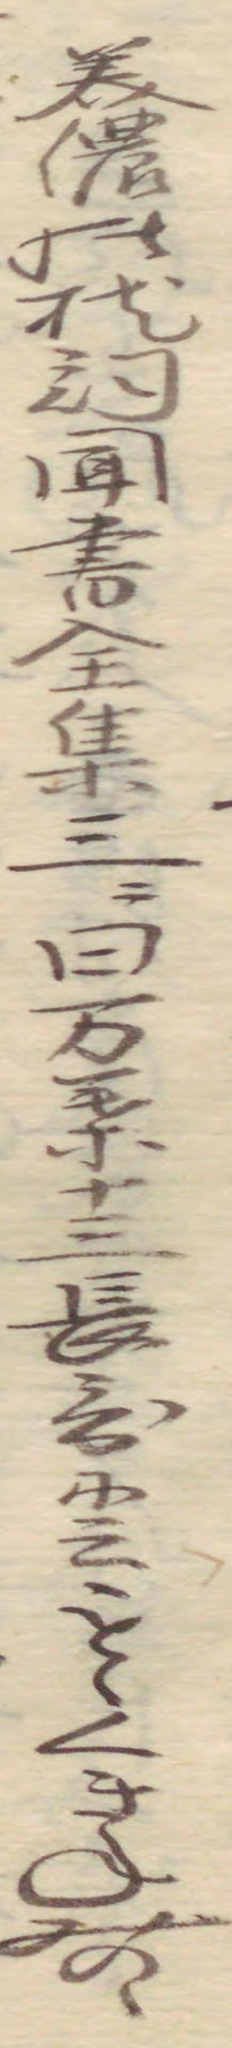美濃の枕詞聞書全集三ニ曰万葉十三長歌ニ云もゝくきねみのゝ
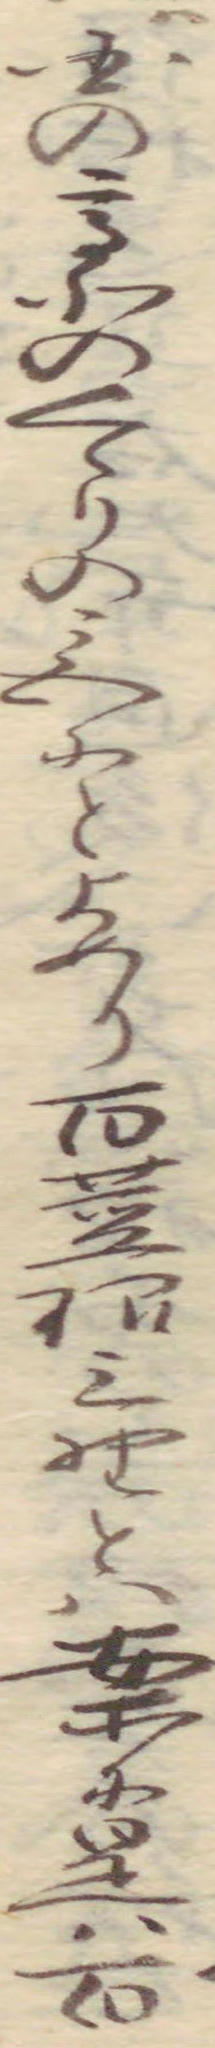国の高北のくゝりの宮にとよめり百茎根三野とは案に是は百
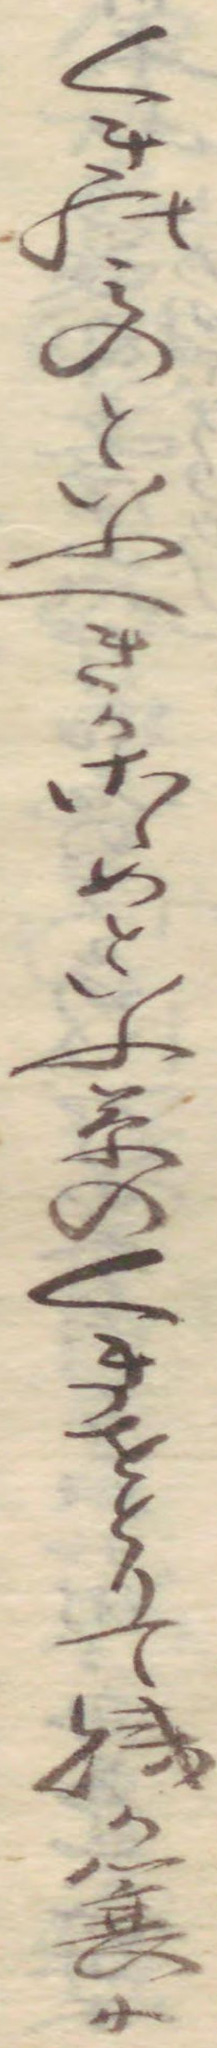くきのみのといふへきかこゝめといふ草のくきをとりて残か蓑に
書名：鶯宿雑記. 巻263-264
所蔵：国立国会図書館 National Diet Library, JAPAN
